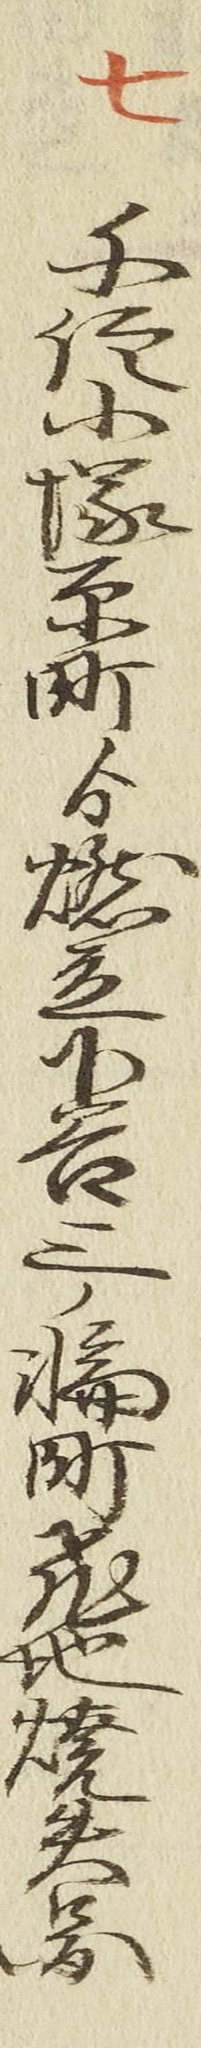一千住小塚原町ゟ燃立下谷三ノ輪町飛地焼失図
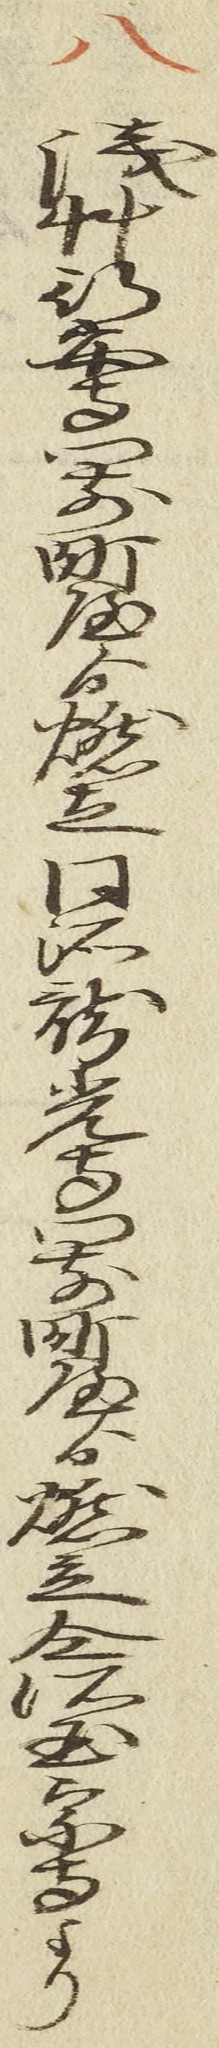一浅草行安寺門前町屋ゟ燃立同所龍光寺門前町屋ゟ燃立同所玉宗寺より
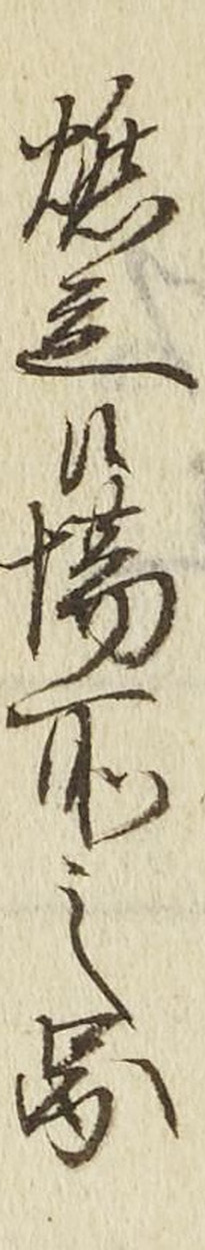燃立候場所之図
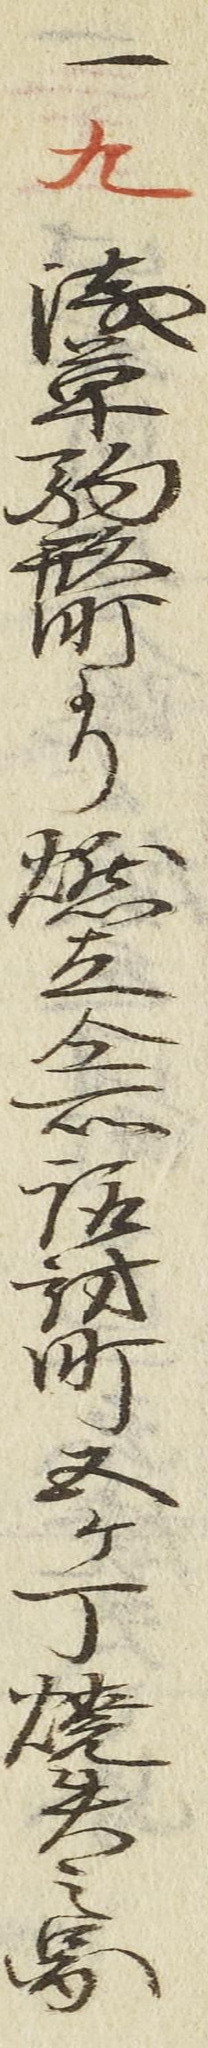一浅草駒形町より燃立同所諏訪町五ケ丁焼失之図
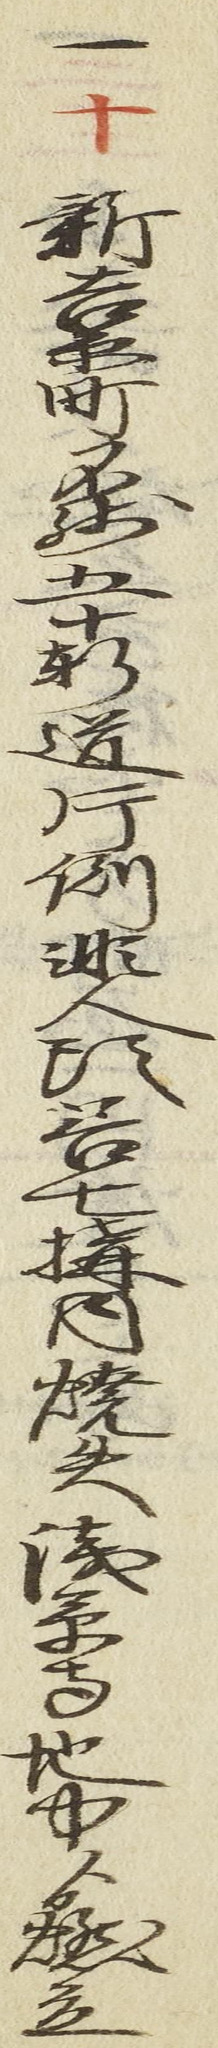一新吉原町不残五十軒道片側非人頭善七構内焼失浅草寺地中ゟ燃立
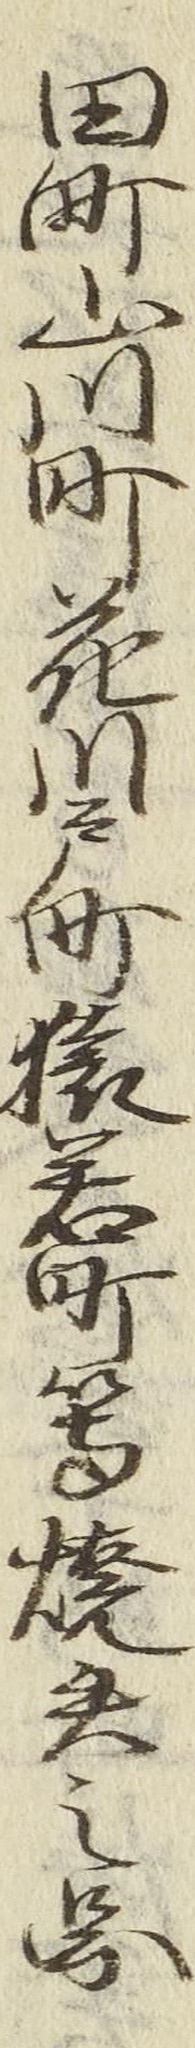田町山川町花川戸町猿若町等焼失之図
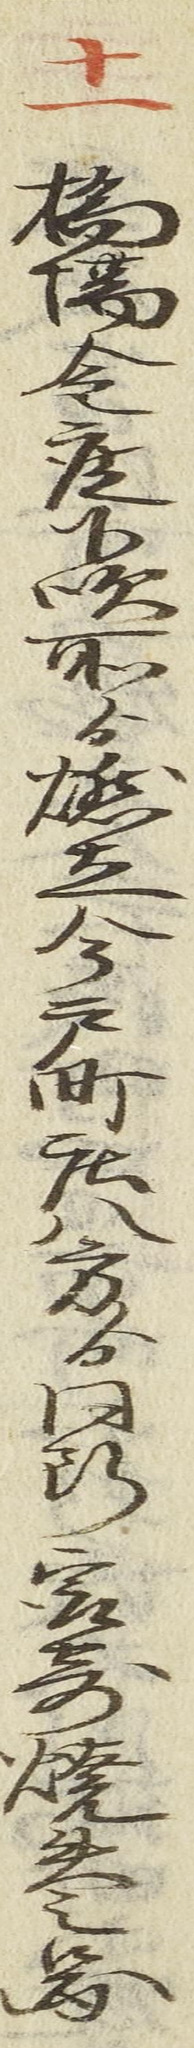一橋場金座下吹所ゟ燃立今戸町庄八方ゟ同断最寄焼失之図
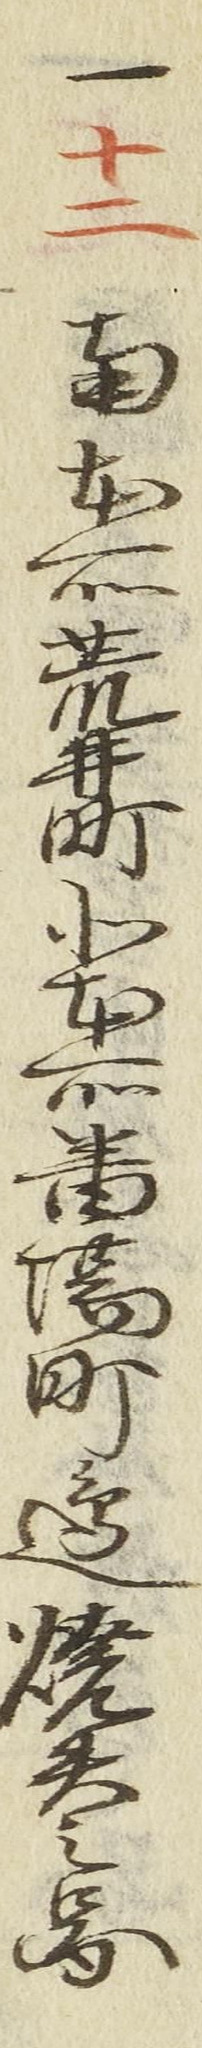一南本所荒井町北本所番場町辺焼失之図
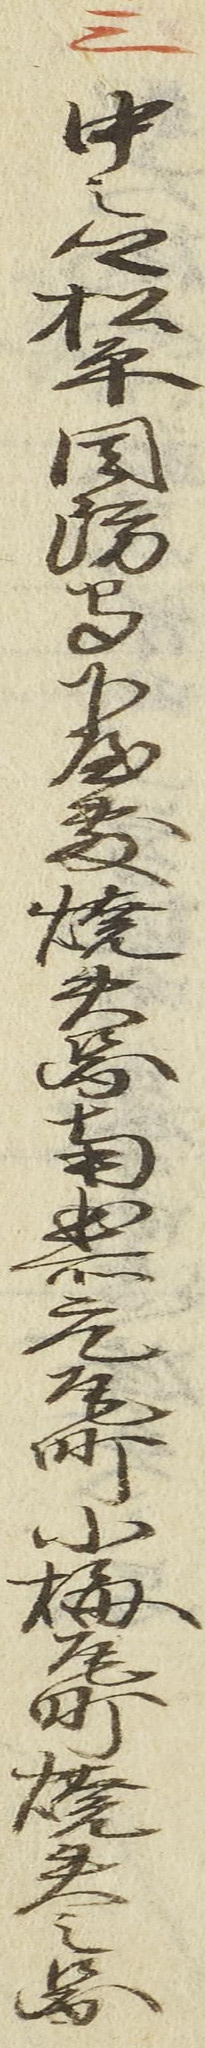一中之郷松平周防守下屋敷焼失図南本所元瓦町小梅瓦町焼失之図
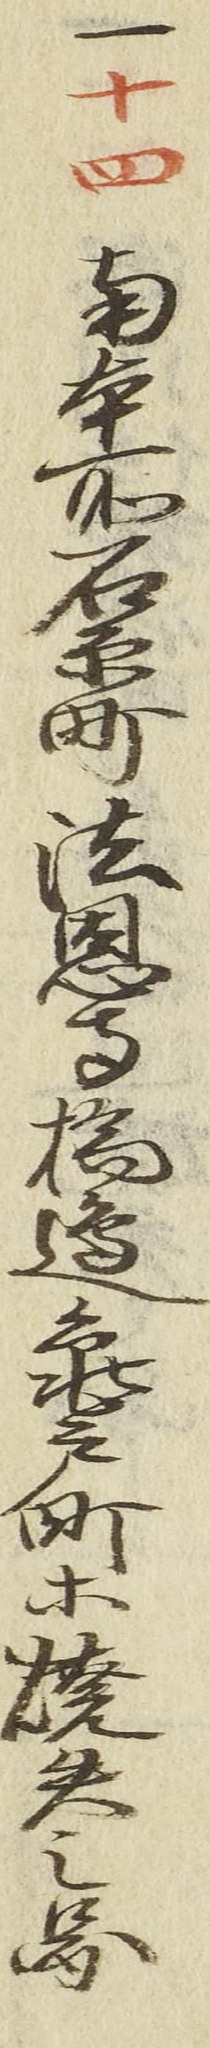一南本所石原町法恩寺橋辺亀戸町等焼失之図
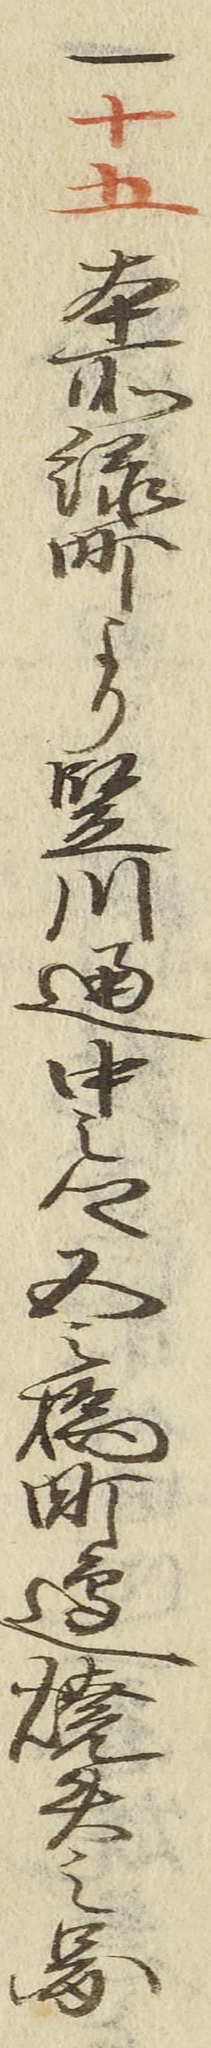一本所緑町より竪川通中之郷五之橋町辺焼失之図

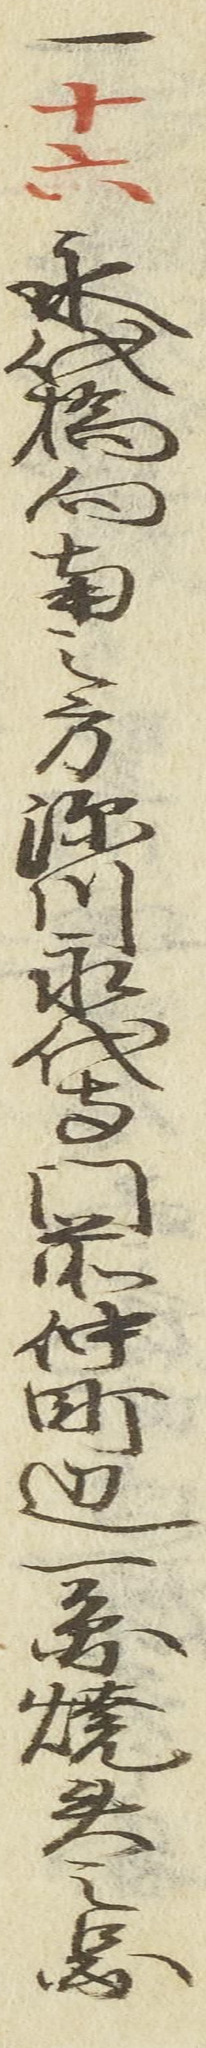一永代橋向南之方深川永代寺門前仲町辺一円焼失之図
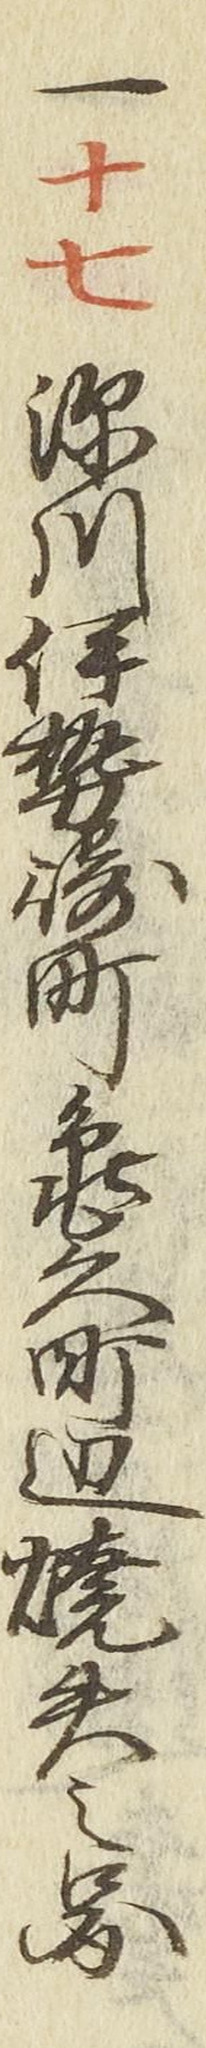一深川伊勢崎町亀久町辺焼失之図
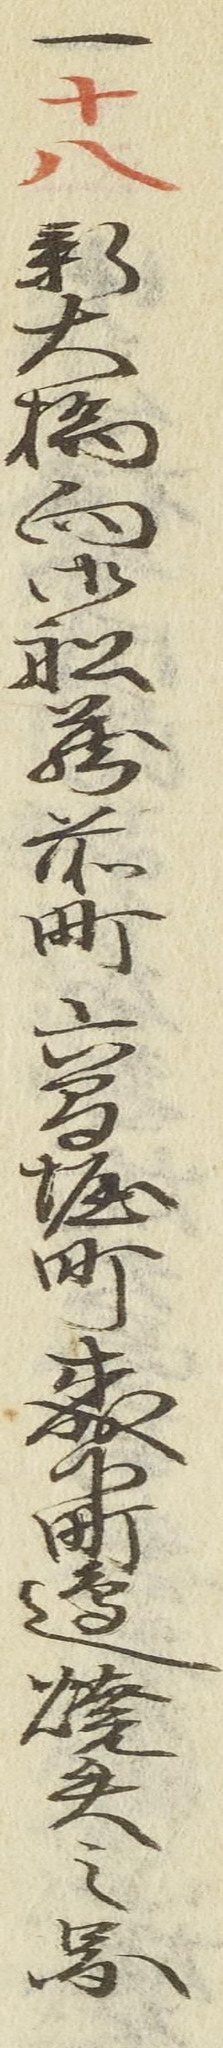一新大橋向船蔵前町六間堀町森下町焼失之図
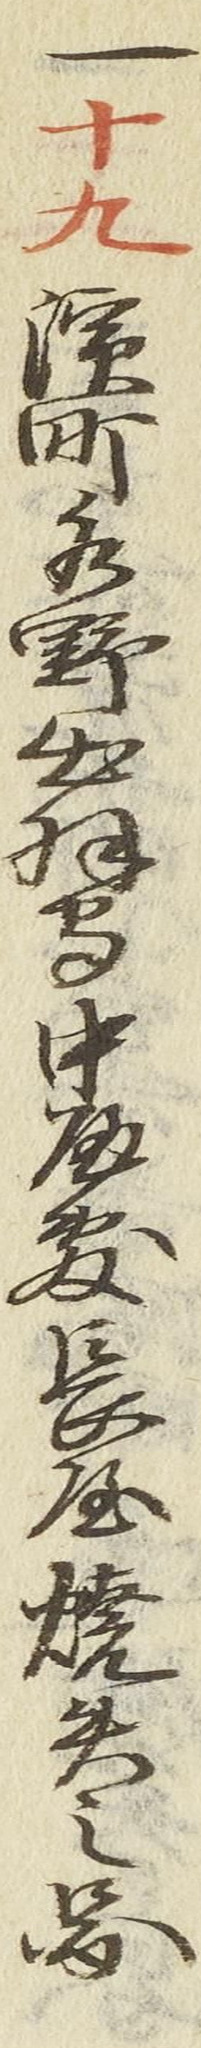一浜町水野出羽守中屋敷長屋焼失之図
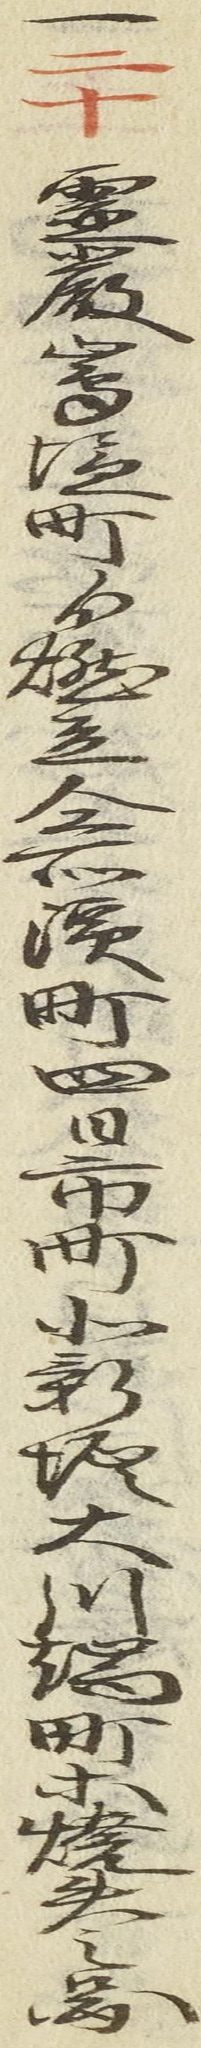一霊厳島浜町ゟ燃立同所浜町四日市町北新堀大川端町等焼失之図
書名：安政二年震災記事　完
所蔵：東京大学地震研究所図書室 Earthquake Research Institute Library, The University of Tokyo, JAPAN
